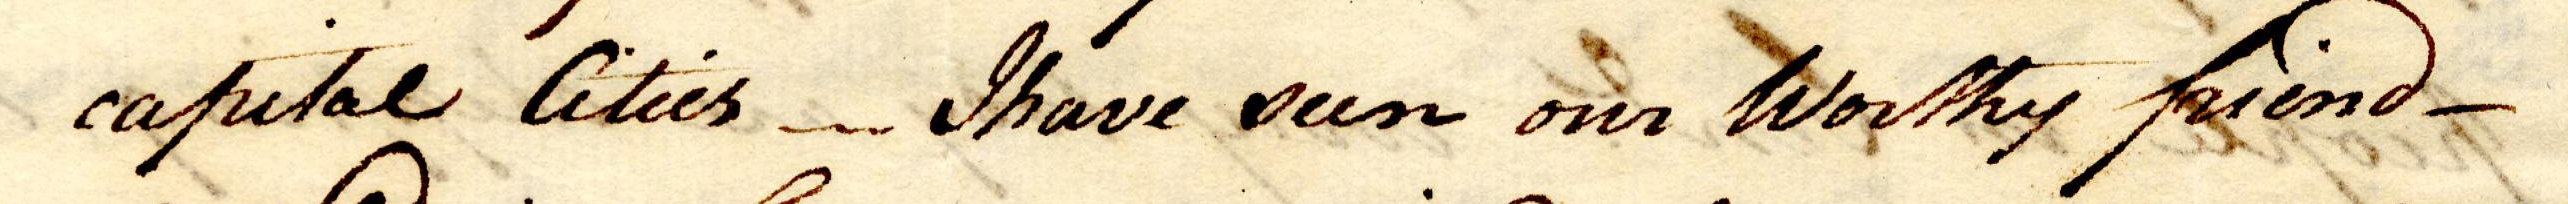capital Cities- I have seen our Worthy friend-
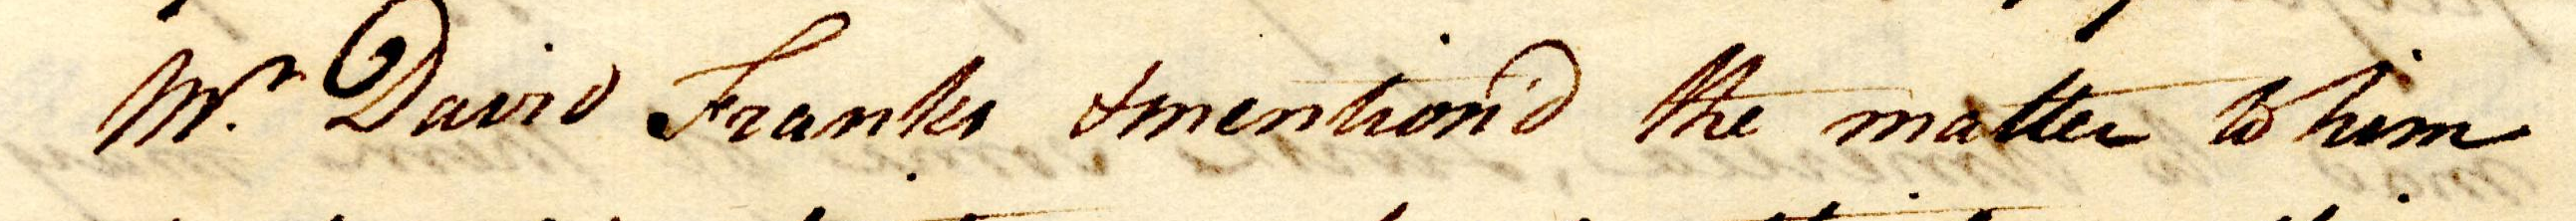M^r. David Franks & mention'd the matter to him
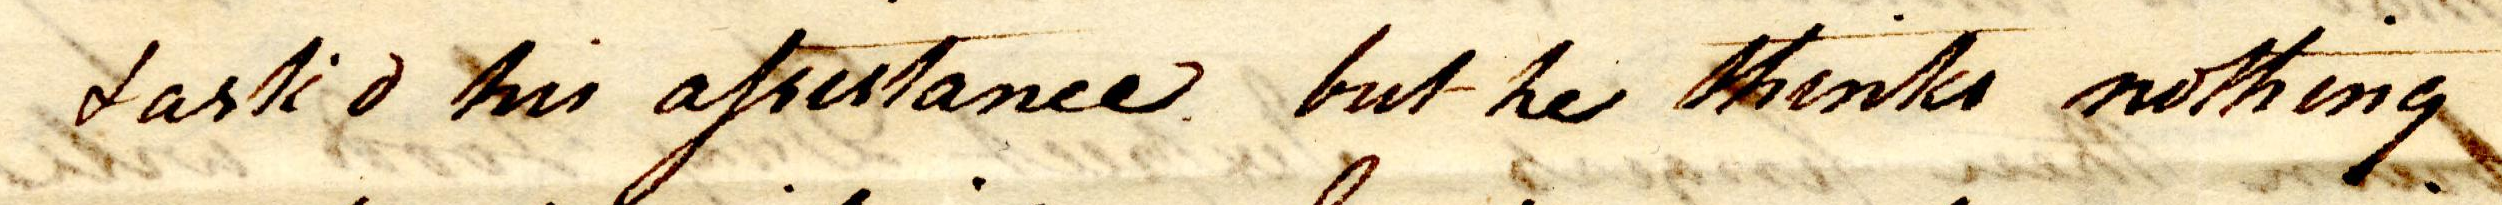& ask'd his assistance. but he thinks nothing
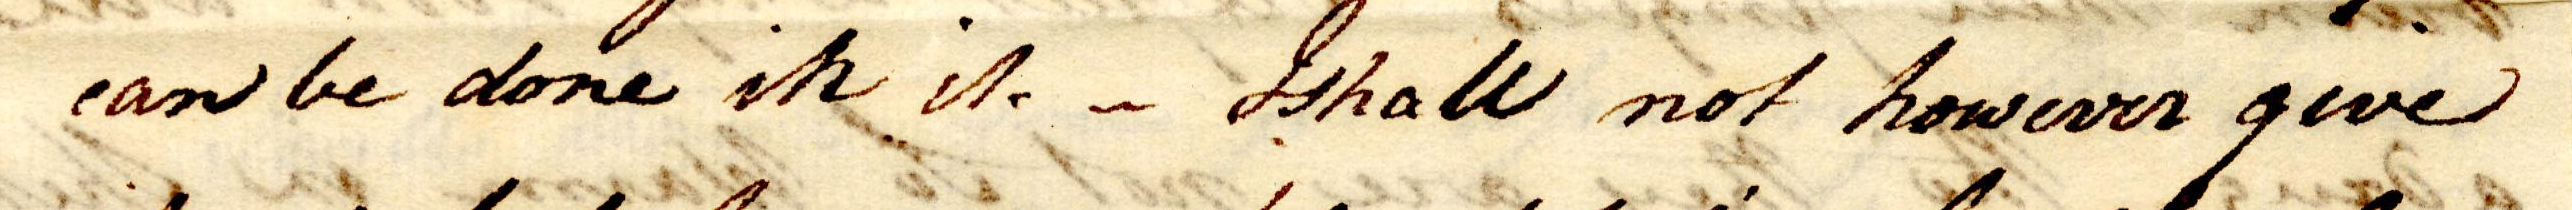can be done in it.- I shall not however give
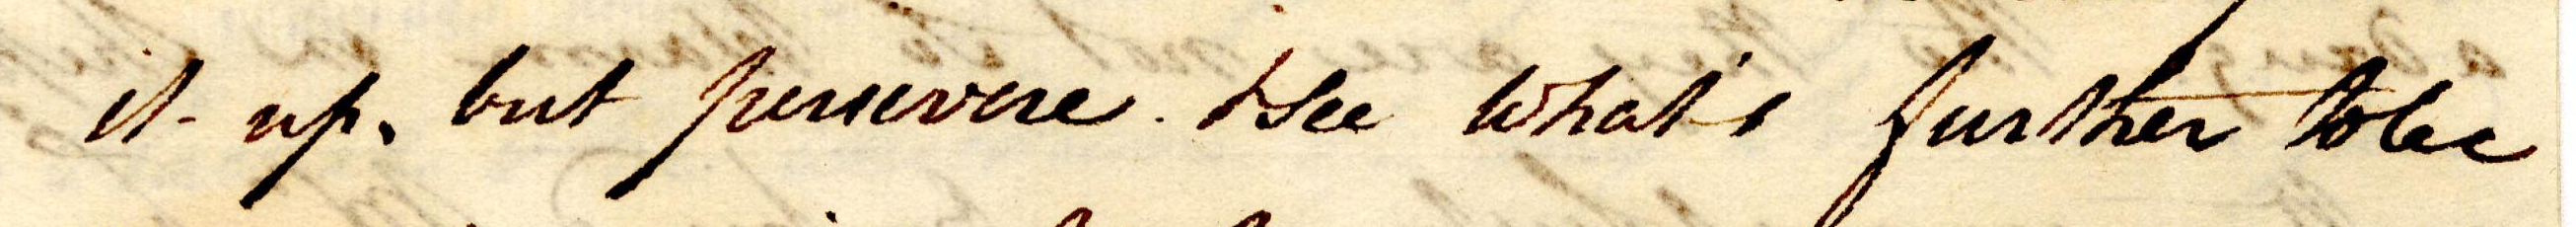it up, but persevere. & see what's further to be
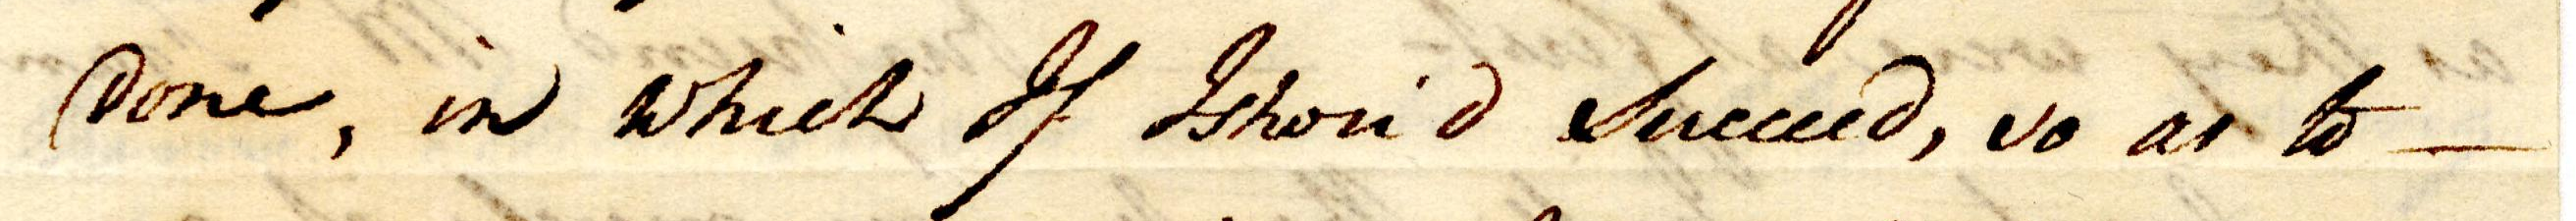done, in which of I shou'd succeed, so as to
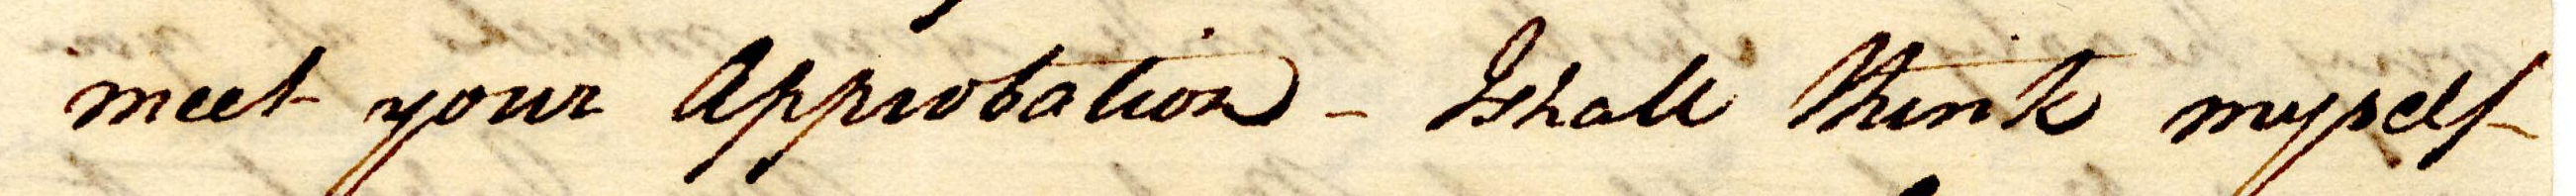meet your approbation- I shall think myself
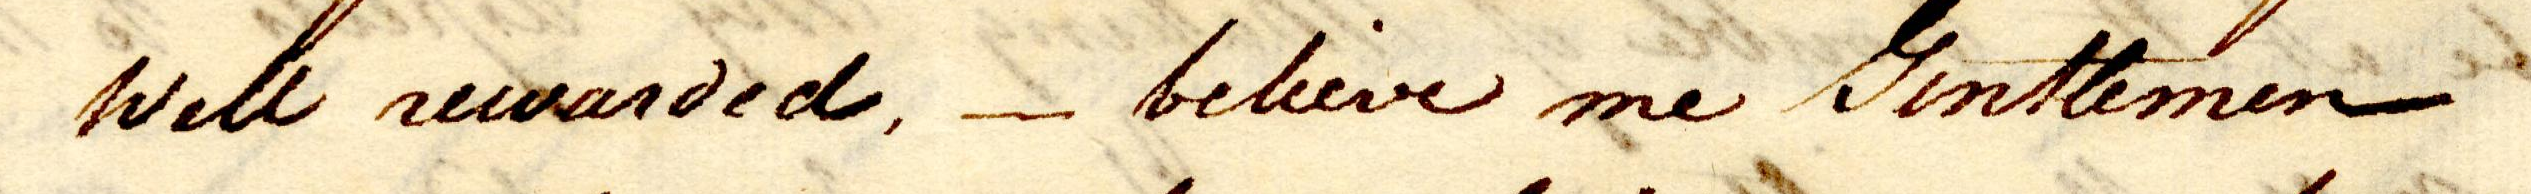well rewarded.- believe me Gentlemen
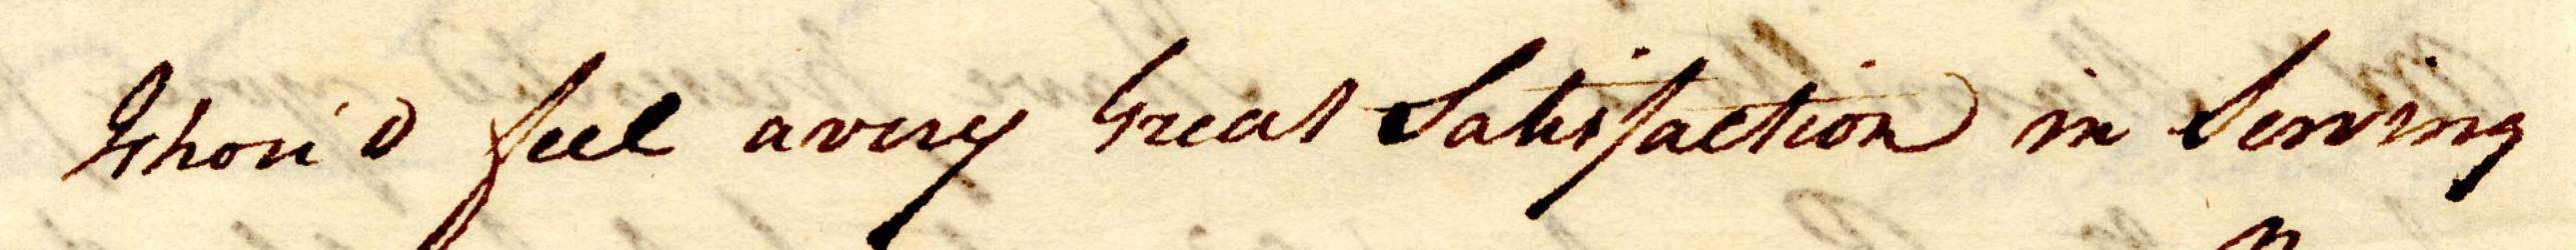shou'd feel a very great Satisfaction in Serving
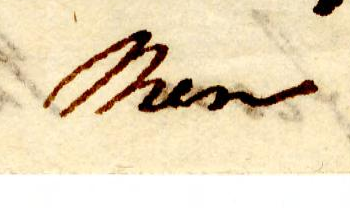Men
